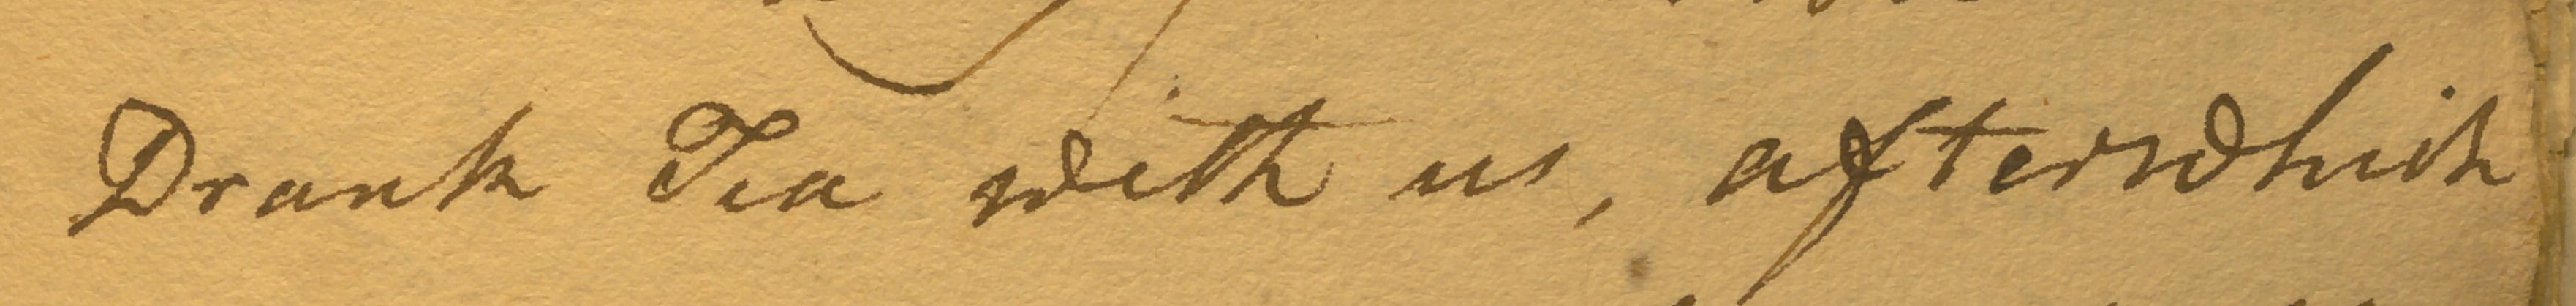Drank Tea with us, after which
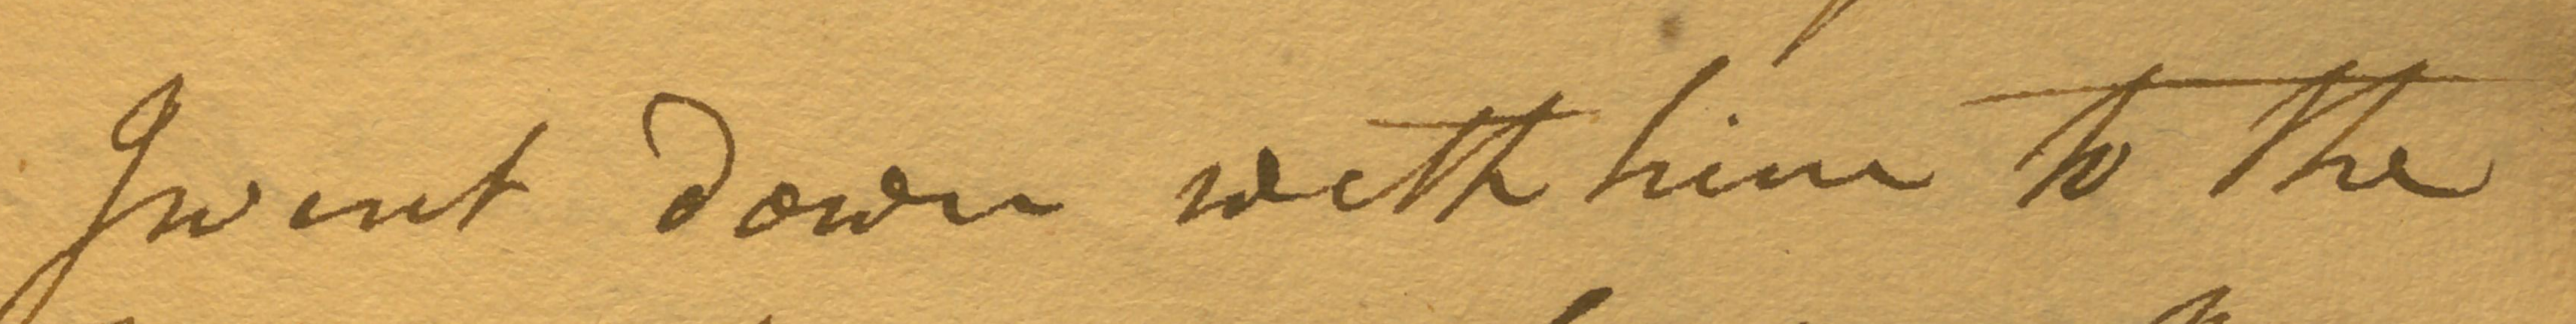I went down with him to the
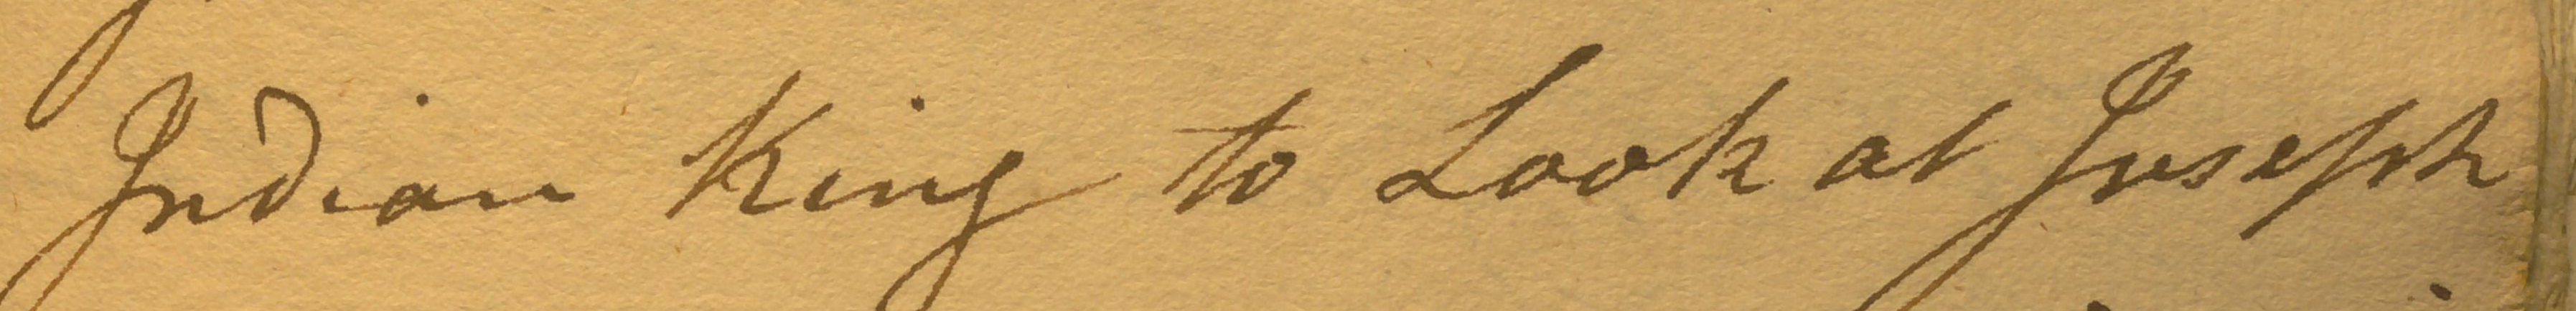Indian King to Look at Joseph
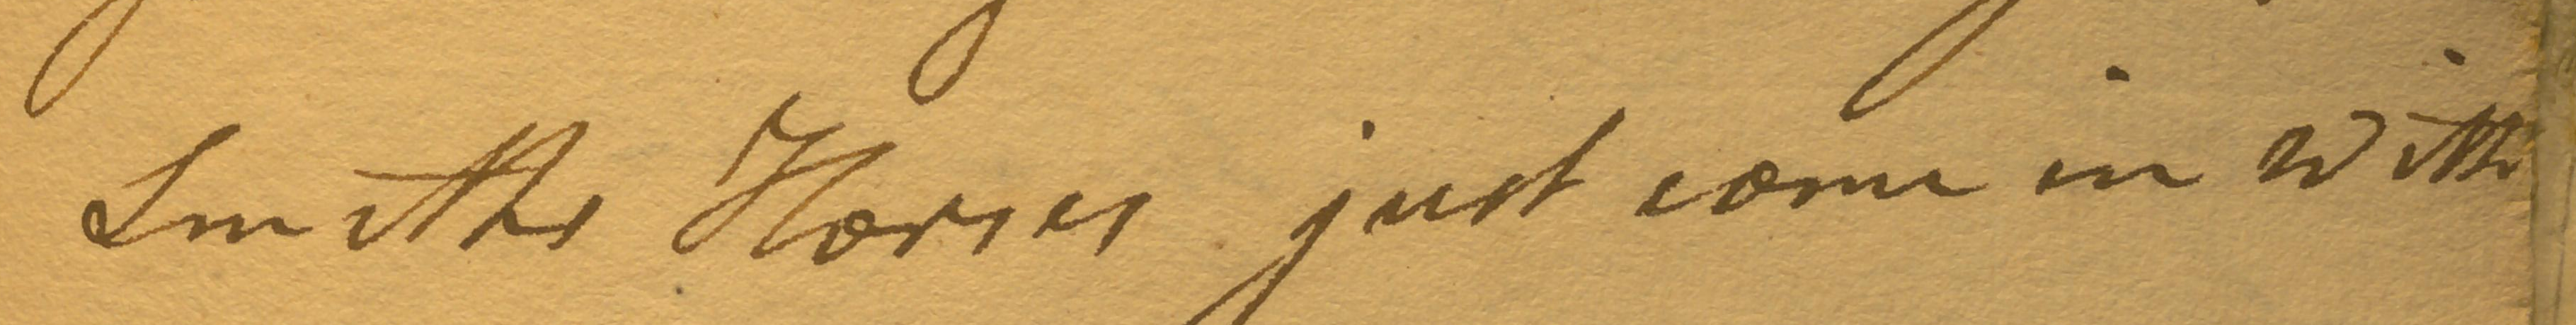Smiths Horses just came in with
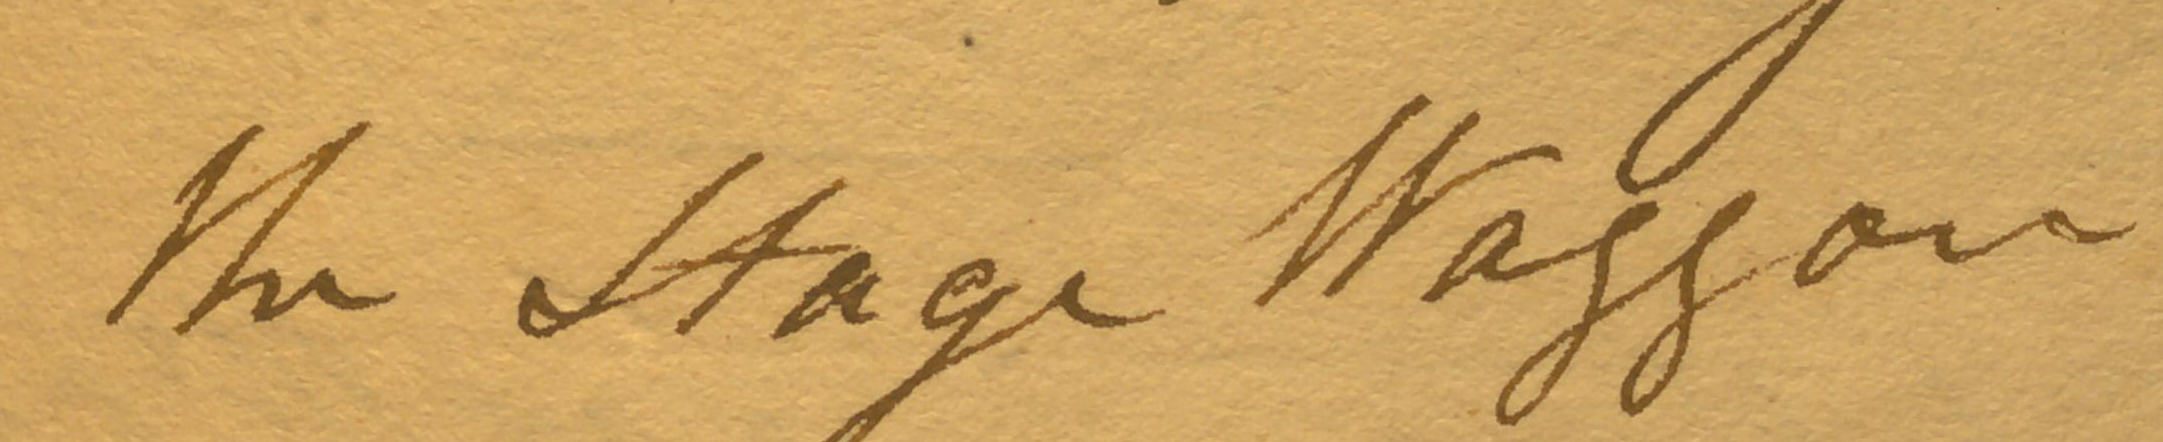the Stage Waggon
